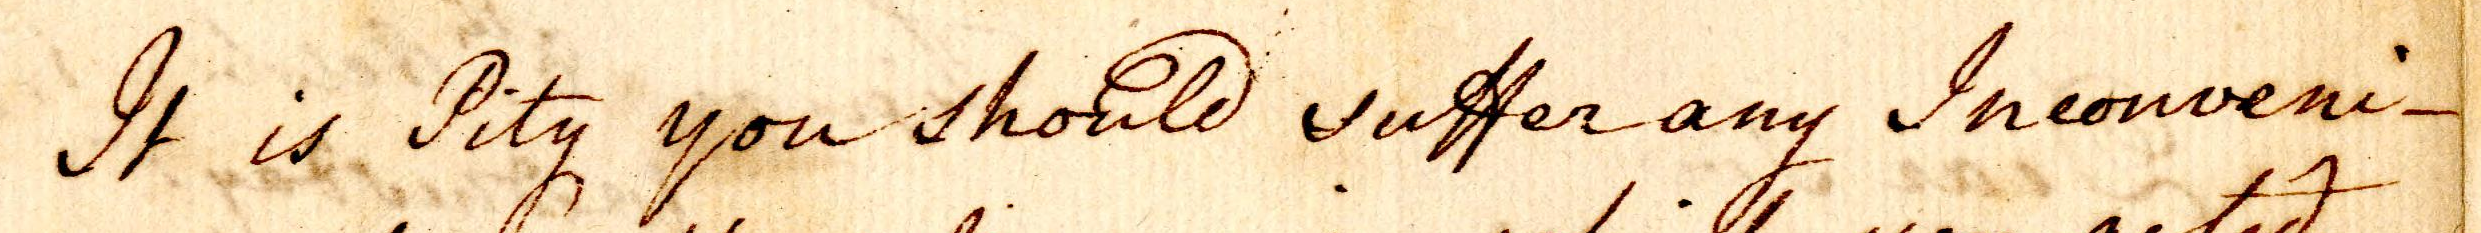It is Pity you should suffer any Inconveni-
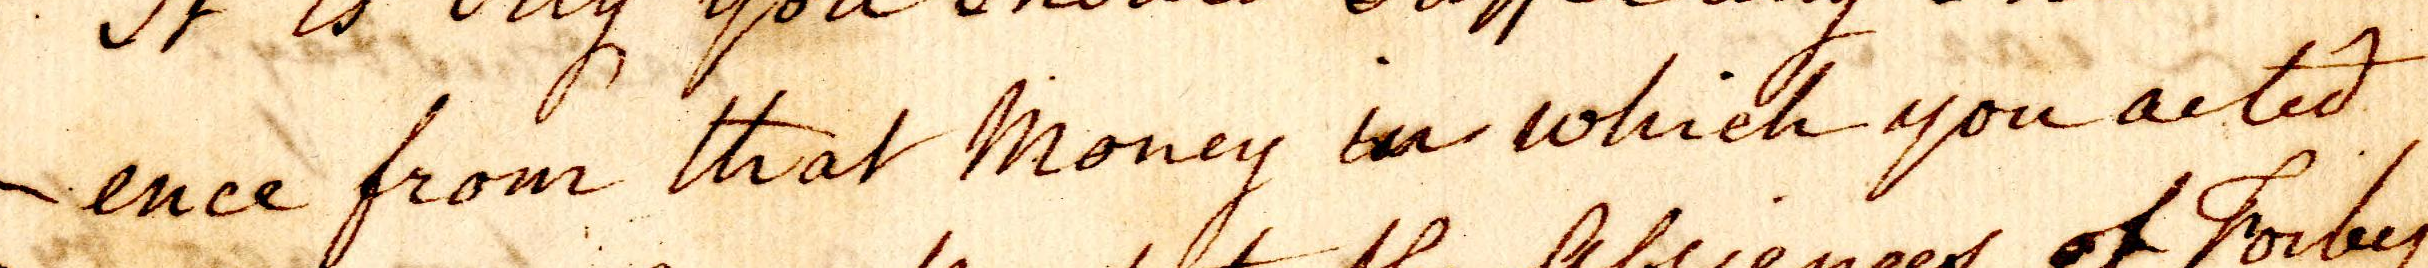-ence from that money in which you acted
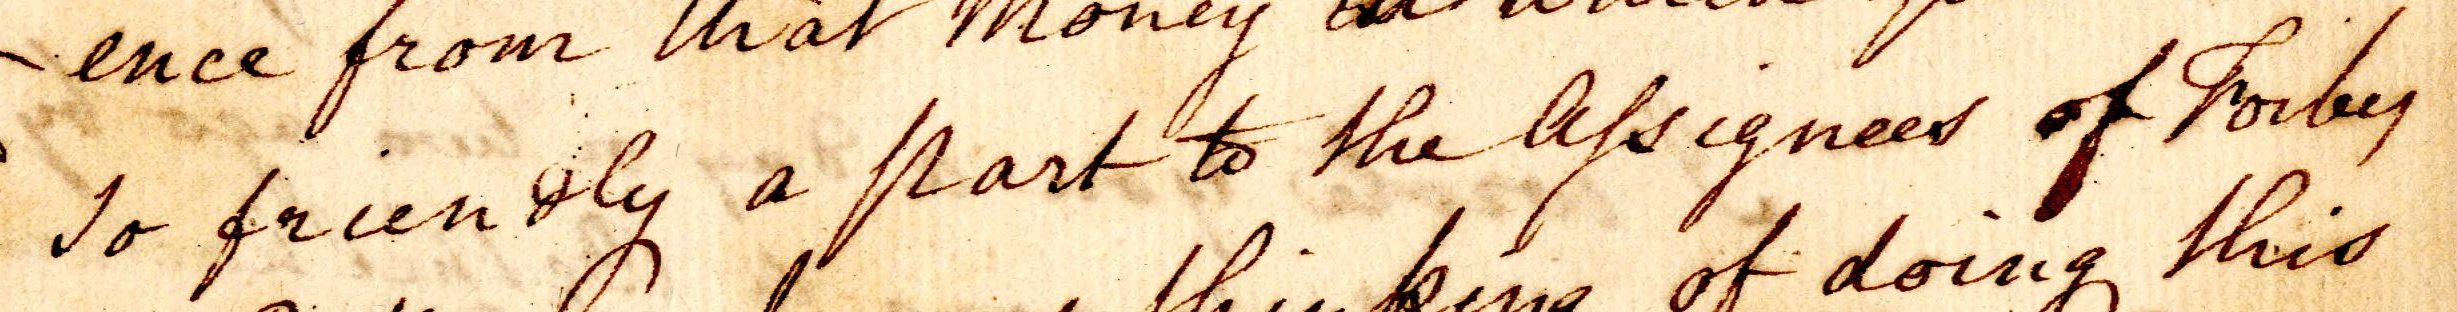so friendly a part to the Assignees of Forbes
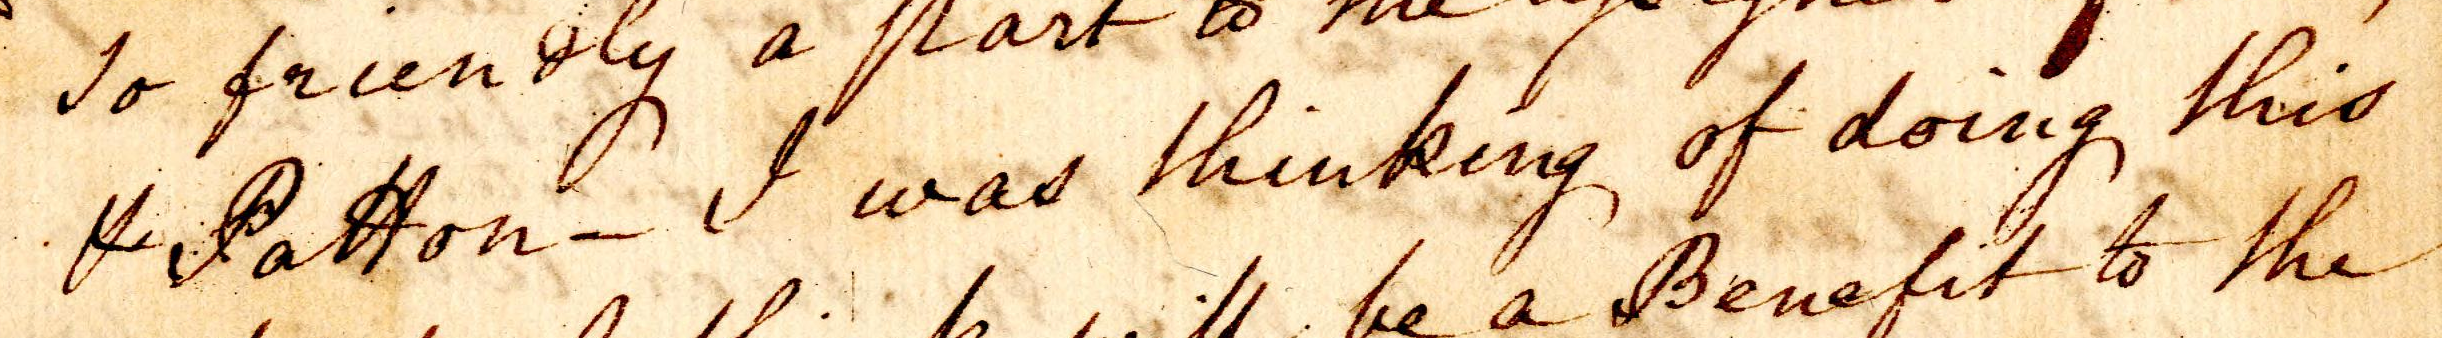& Patton- I was thinking of doing this
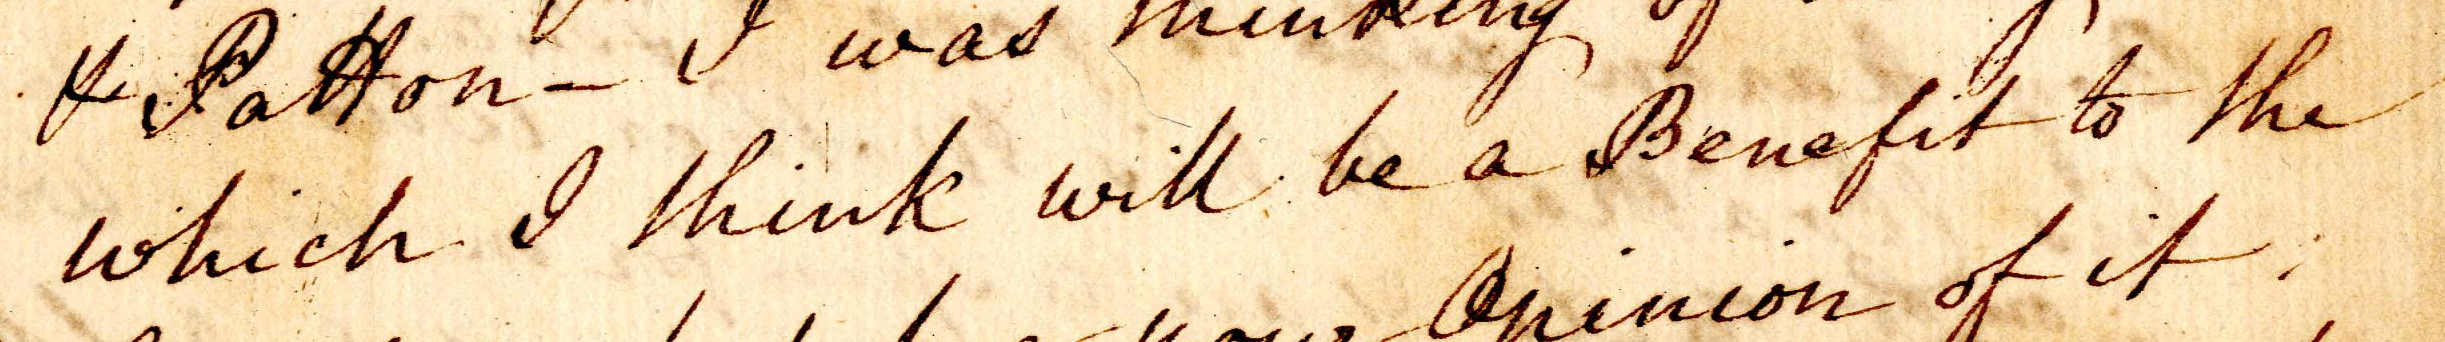which I think will be a Benefit to the
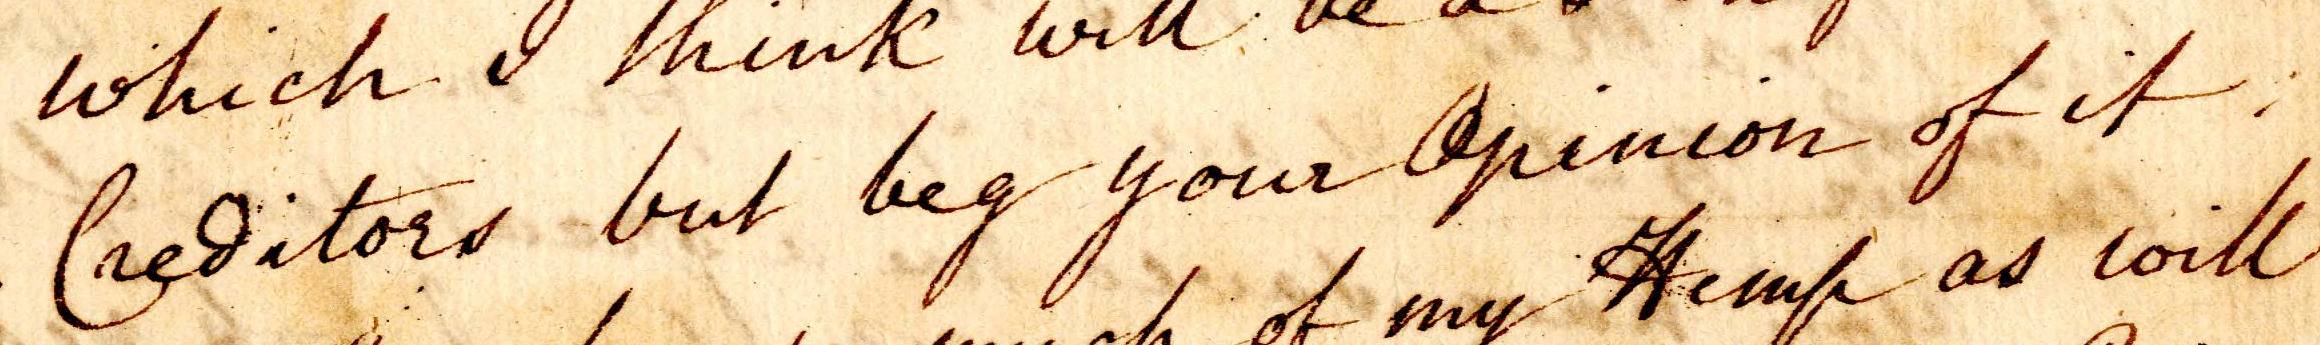Creditors but beg your Opinion of it:
